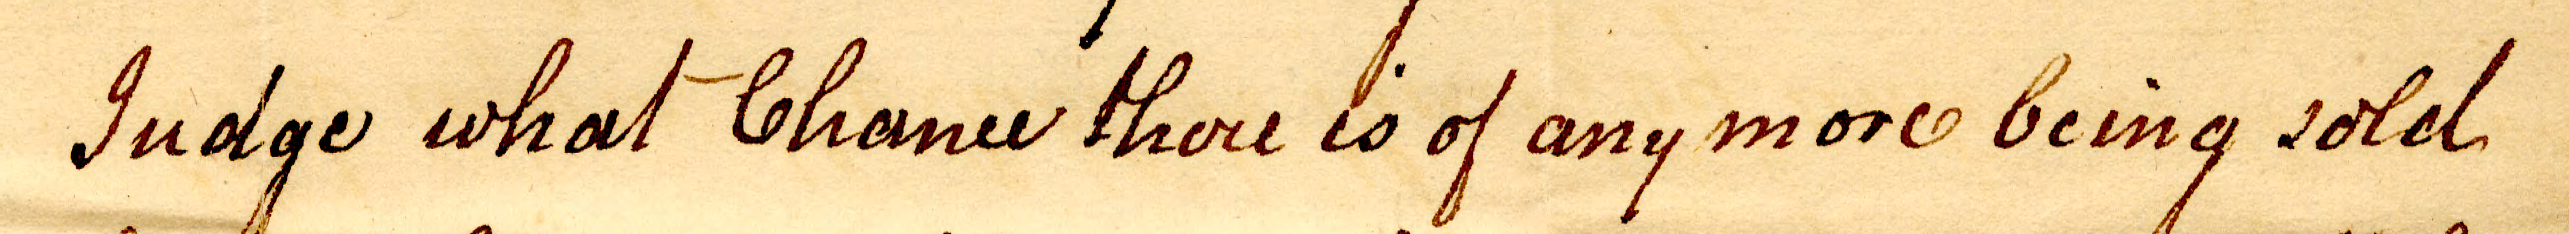Judge what Chance there is of any more being sold
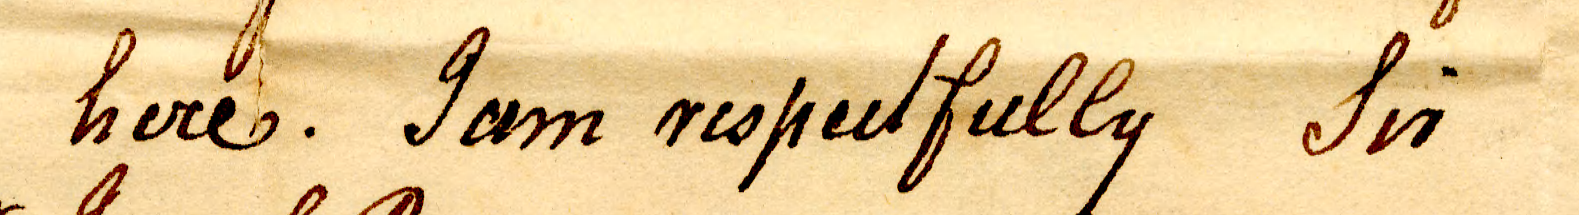here. I am respectfully Sir
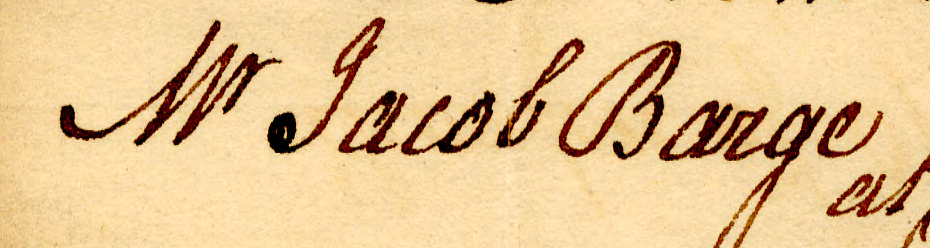M^r Jacob Barge
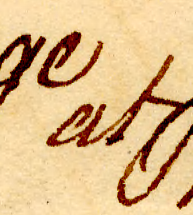at
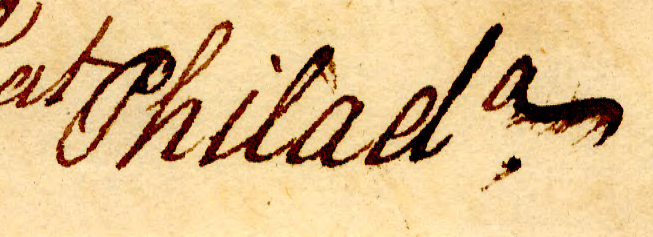Philad^a.
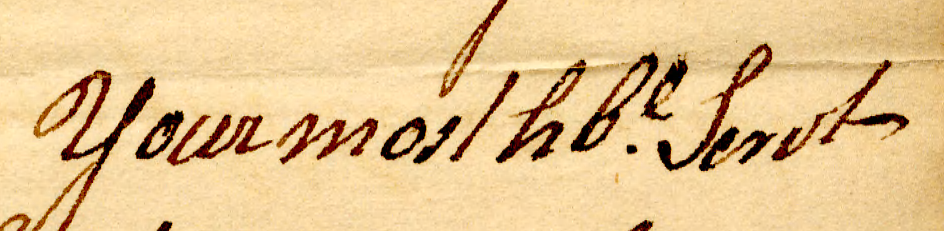Your most hb^l. Servt
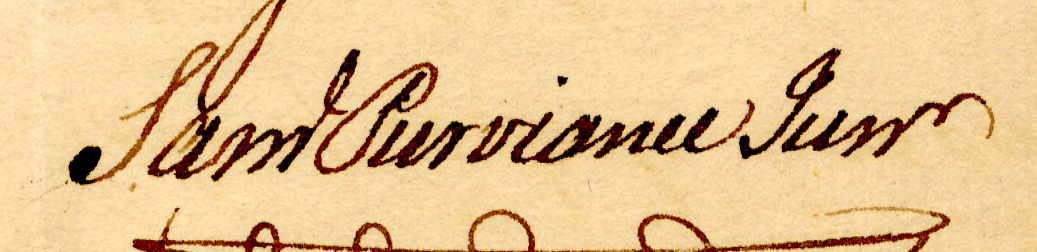Sam^l Purviance Jun^r
